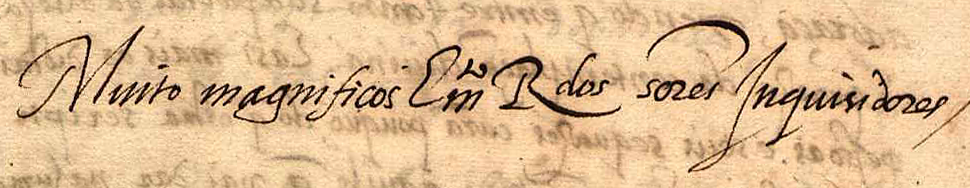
Muito magnificos E mto Rdos s̄ores Jnquisidores /
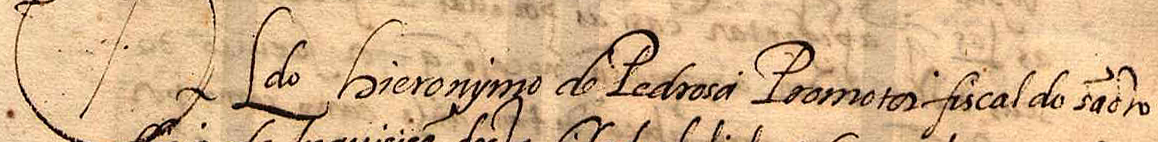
O Ldo hieronymo de Pedrosa Promotor fiscal do s̄acto
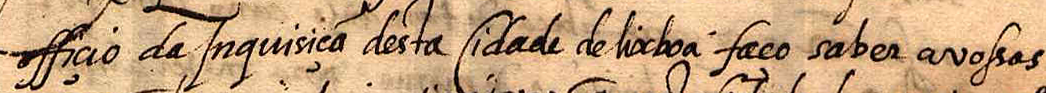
officio da Jnquisiçā desta Cidade de lixboa faço saber a vossas
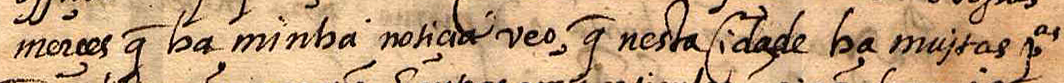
merces q̄ ha minha noticia veo, q̅ nesta Cidade ha mujtas pas
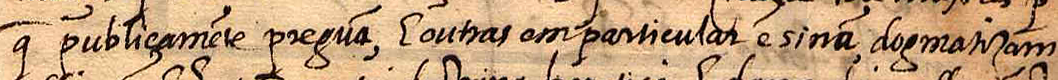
q̄ publicamēte preguā, E outras em particular esinā dogmatizam
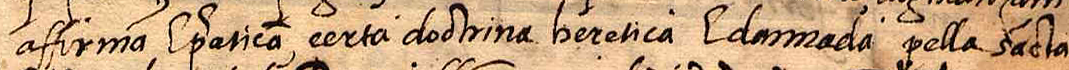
affirmā E p̄aticā, certa doctrina heretica E damnada pella sa̅cta
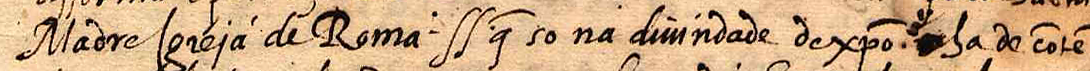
Madre Jgreja de Roma .ss. q̄ so na diuindade de xpō _ ha de cōtē
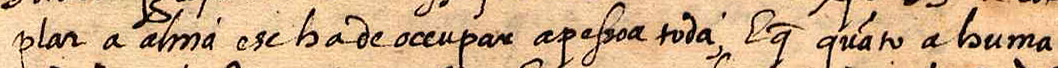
plar a alma e se ha de occupar a pessoa toda, E q̄ quāto a huma
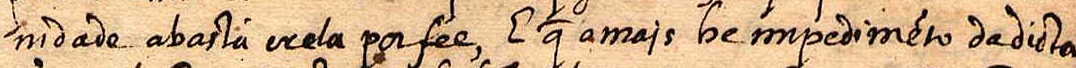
nidade a basta crela por fee, E q̄ a majs he impedimēto da dicta
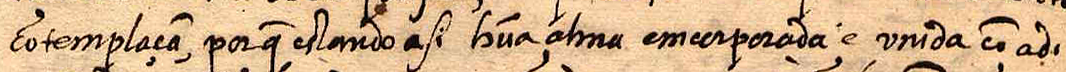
cōtemplaçā, porq̅ estando asi hūa alma emcorporada e vnida c̄o a di
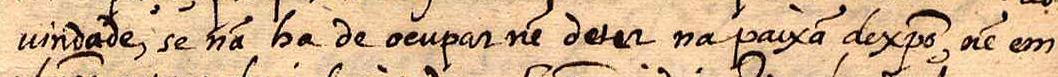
uindade, se nā ha de ocupar ne̅ deter na paixā de xpō, nē em
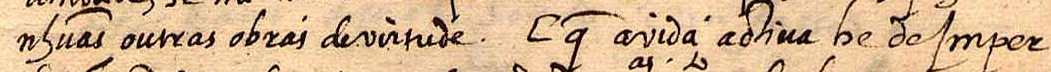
nhu̅as outras obras de virtude. E q̄ a vida actiua he de Jmper
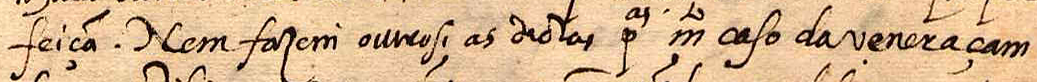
feiçā. Nem fazem outrosi as dictas pas mto caso da veneraçam
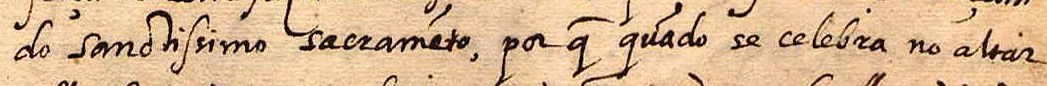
do sanctissimo sacramēto, porq̄ quādo se celebra no altar
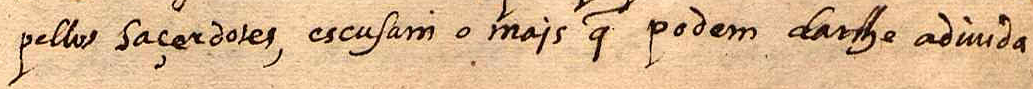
pellos sacerdotes, escusam o majs q̄ podem darlhe a diuida
